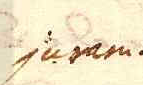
juram.
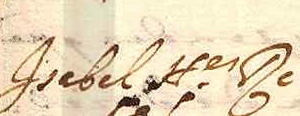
Jsabel H.es Ré
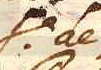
f.a de
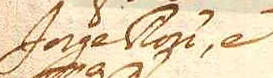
Jorge Roiz̄, e
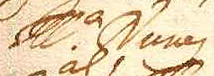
M.a Nunes
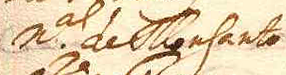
n.al de Monsanto
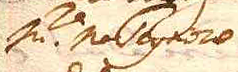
m.ra no Teyxozo
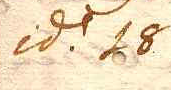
id.e 18
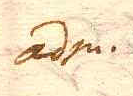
adm.
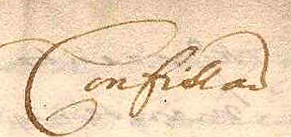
Confissaõ
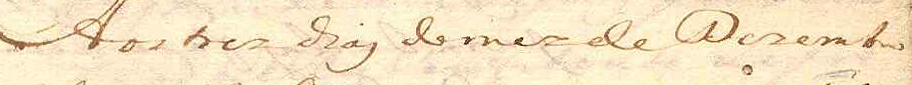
Aos trez dias do mez de Dezembro
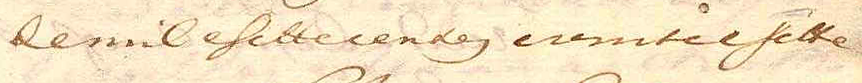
de mil e settecentos e vinte e sette
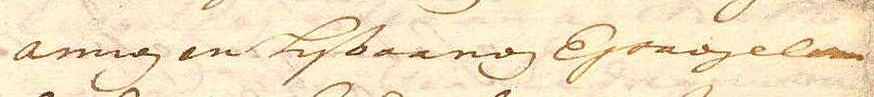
annos en Lisboa nos Estaos e casa
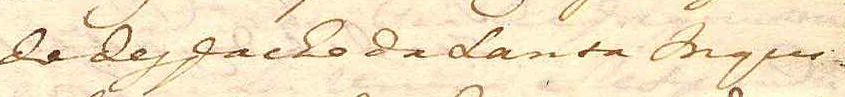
do despacho da Santa Inqui
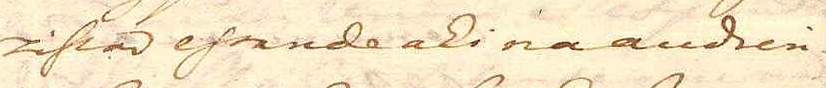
zissaõ estando ahi na audien
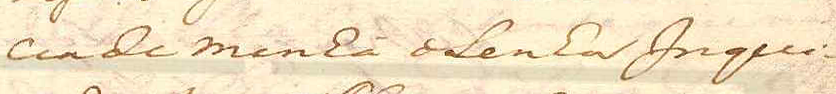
cia de menhã o Senhor Jnqui
